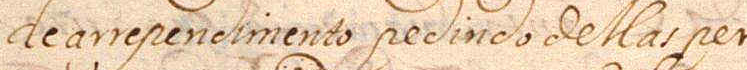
de arrependimento pedindo dellas per
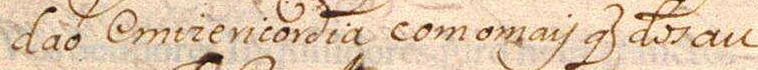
daõ e mizericordia com o mais q̄ dos au
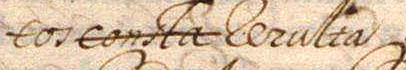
tos consta Rezulta.
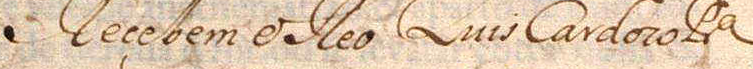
Reçebem o Reo Luis Cardozo Pra
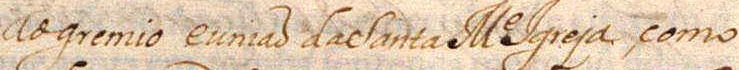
ao gremio e uniaõ da Santa Me Igreja, como
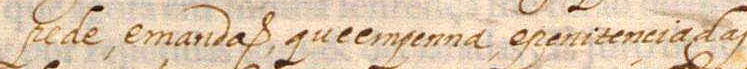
pede, e mandaõ, que em penna, e penitençia das
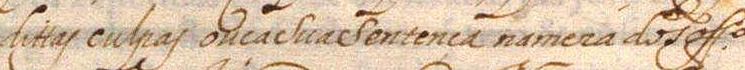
dittas culpas ouça sua sentença na meza do sto off.o
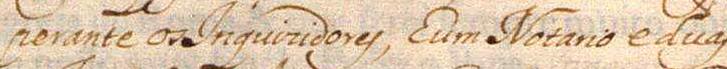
perante os Inquizidores, hum Notario e duas
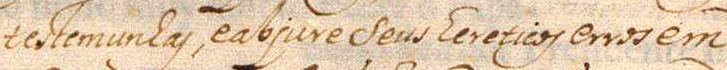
testemunhas, e abjure seus hereticos erros em
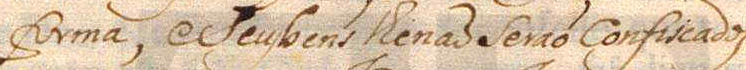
forma, e Seus bens lhe naõ seraõ confiscados
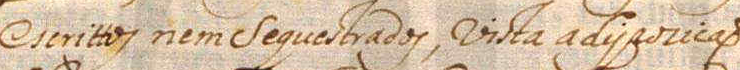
escrittos nem sequestrados, vista a dispozicaõ
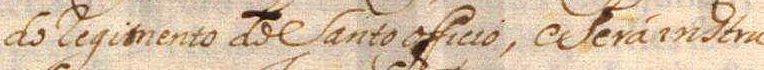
do Regimento do Santo officio, e será instru
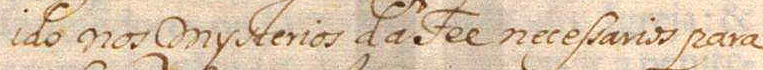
ido nos Mysterios da Fee necessarios para
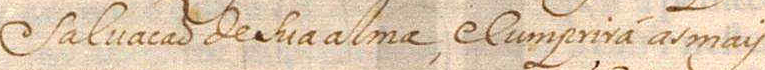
Saluacaõ de sua alma, e Cumprirá as mais
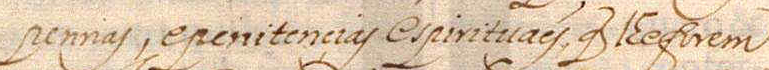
pennas, e penitençias espirituaés, q̄ lhe forem
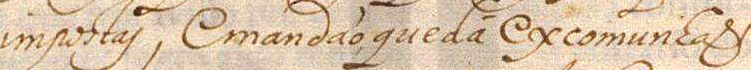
impostas, e mandaõ, que dá excomunhaõ
